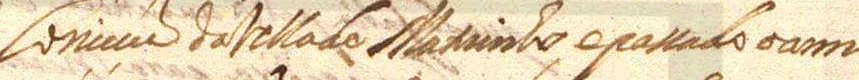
Conçeição da villa do Matrinho, e passado o ann_
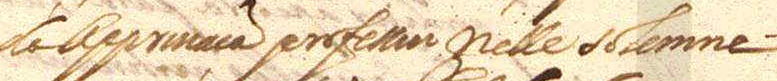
da Approuação professou nelle solemne
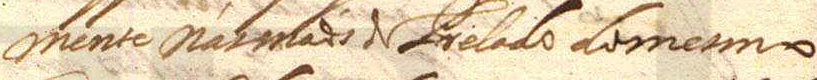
mente nas maõs do Prelado do mesmo
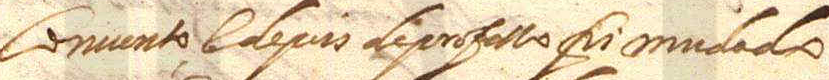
Conuento E depois de professo foi mudado
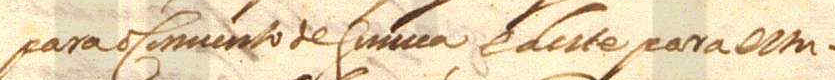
para o Conuento de Gouuea, e deste para estu
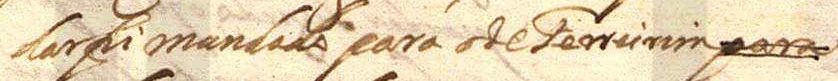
dar foi mandado para o de Ferreirim _
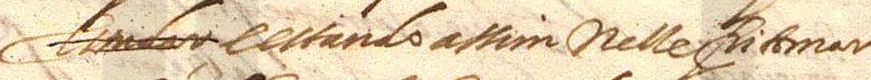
_, e estando assim nelle foi tomar
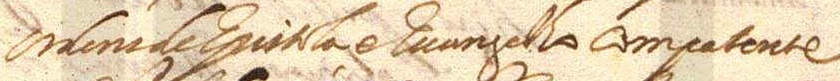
ordens de Epistola, e Euangelho com patente
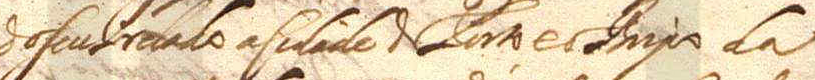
do seu Prelado a Cidade do Porto, e o Bispo da
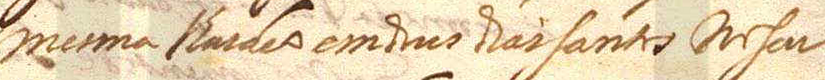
mesma lhas deo em dous dias Santos no seu
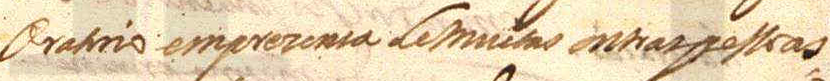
Oratorio em prezensa de muitas outras pessoas
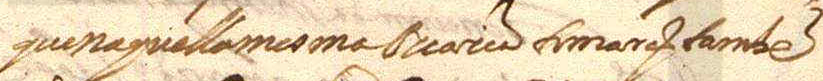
que naquella mesma Occaziaõ tomaraõ tambē
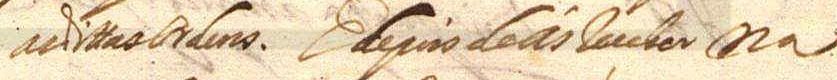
as dittas Ordens. E depois de ás Reçeber na
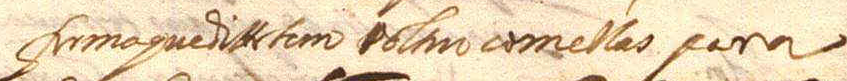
forma que ditto tem voltou com ellas para
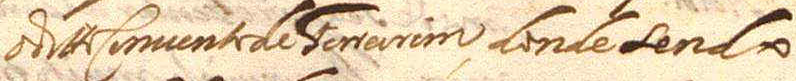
o ditto Conuento de Ferreirim, donde sendo
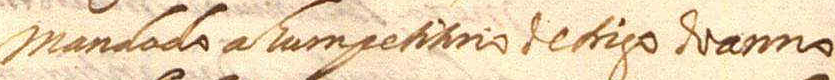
mandado a hum petitorio de trigo do anno
